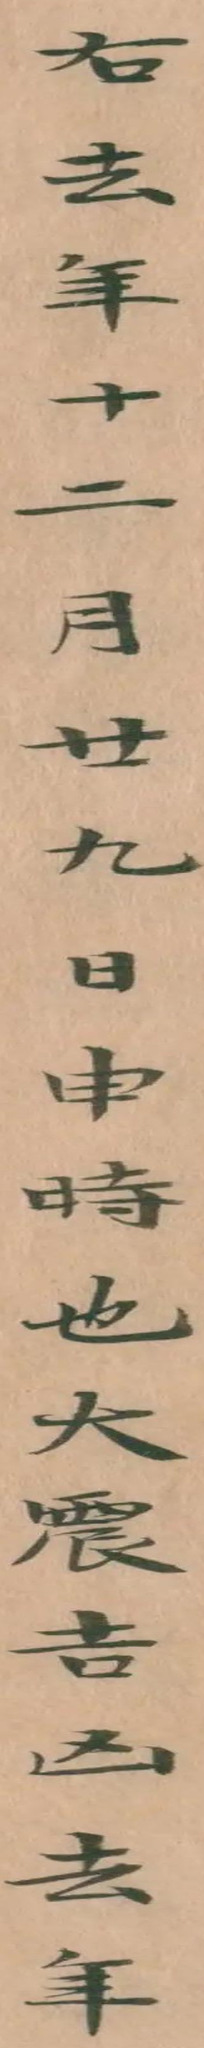右去年十二月廿九日申時也大震𠮷凶去年
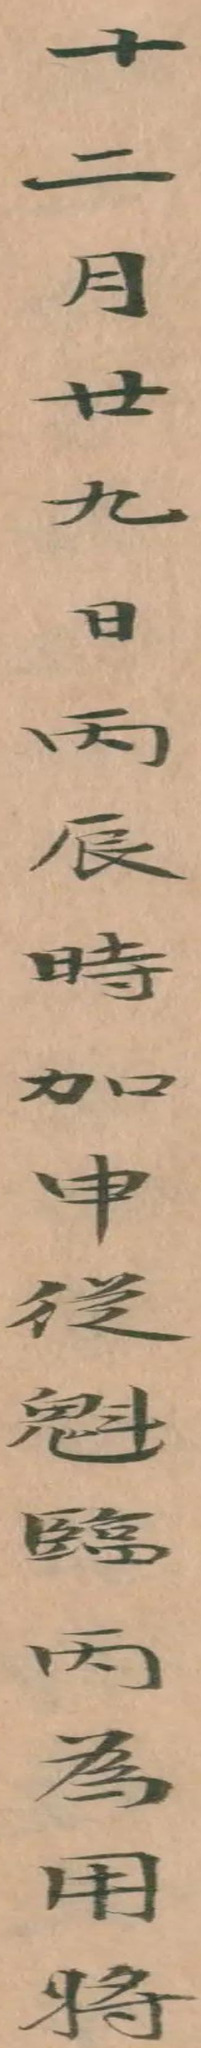十二月廿九日丙辰時加申従魁臨丙為用将
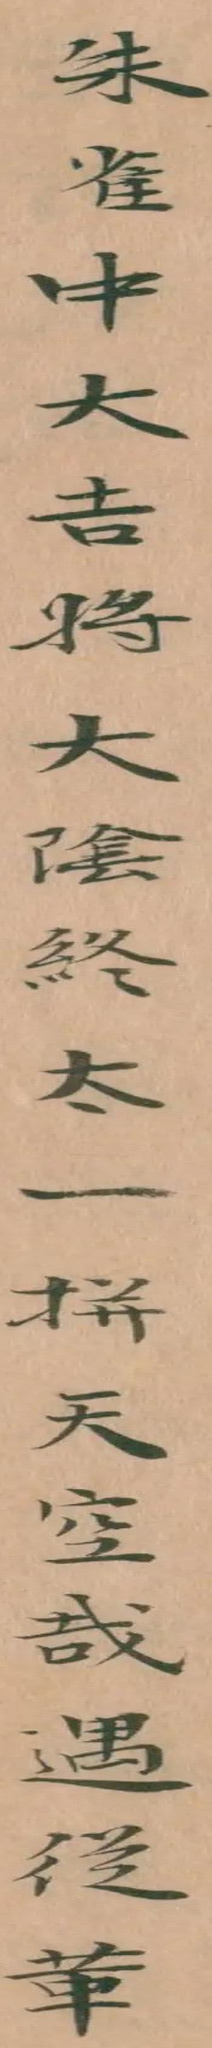朱雀中大𠮷将大陰終太一撰天空哉遇従革
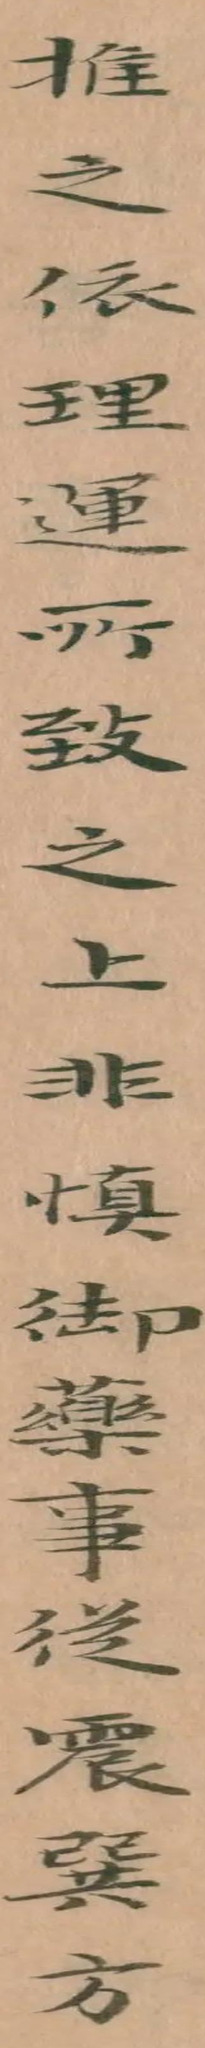推之依理運所致之上非慎御薬事従震巽方
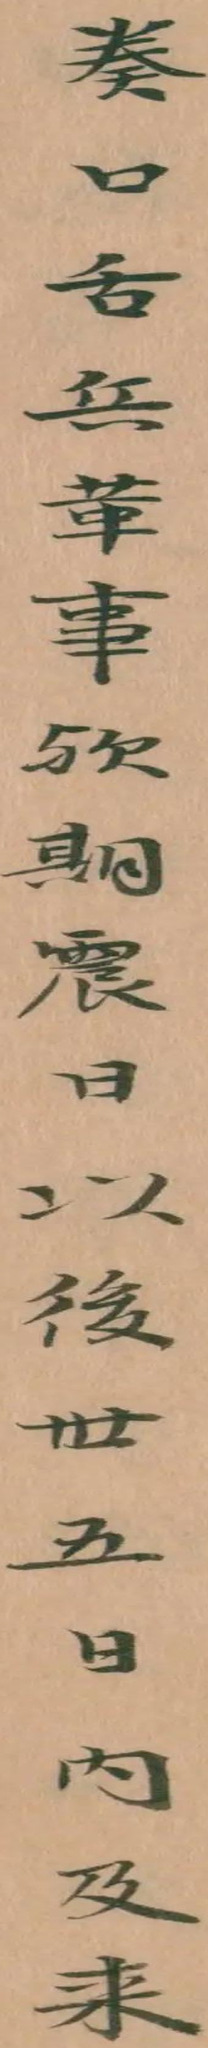奏口舌兵革事歟期震日以後卅五日内及来
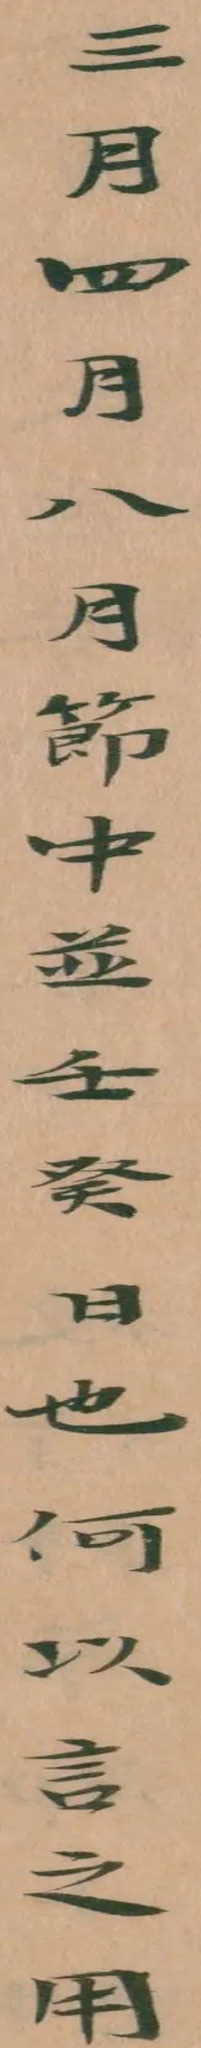三月四月八月節中並壬癸日也何以言之用
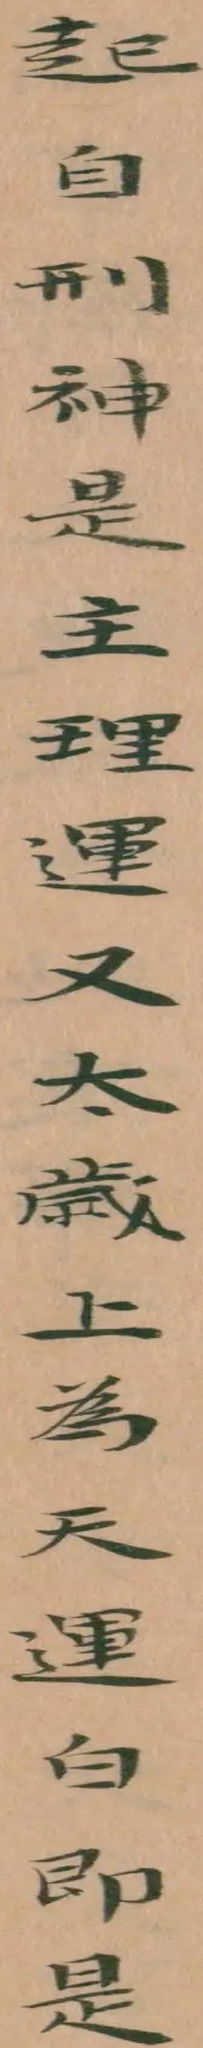起自刑神是主理運又太歳上為天運白即是
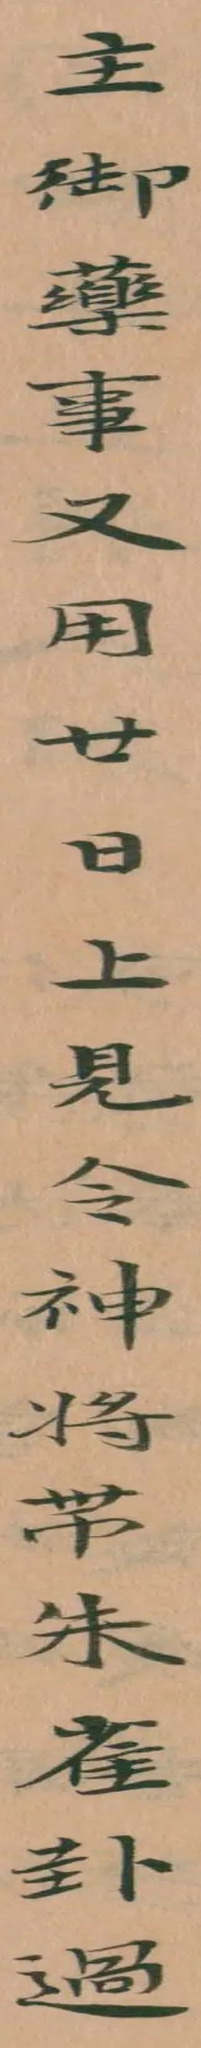主御薬事又用廿日上見令神将帯朱雀卦過
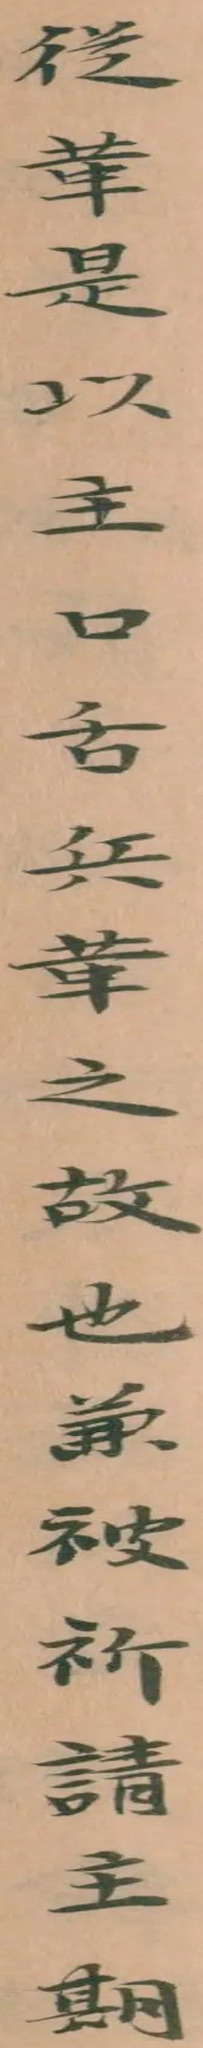従革是以主口舌兵革之故也兼被祈請主期
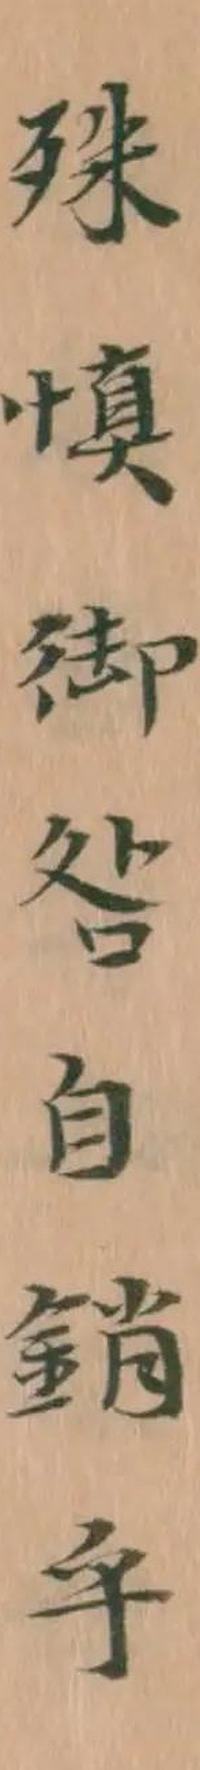殊慎御咎自銷乎
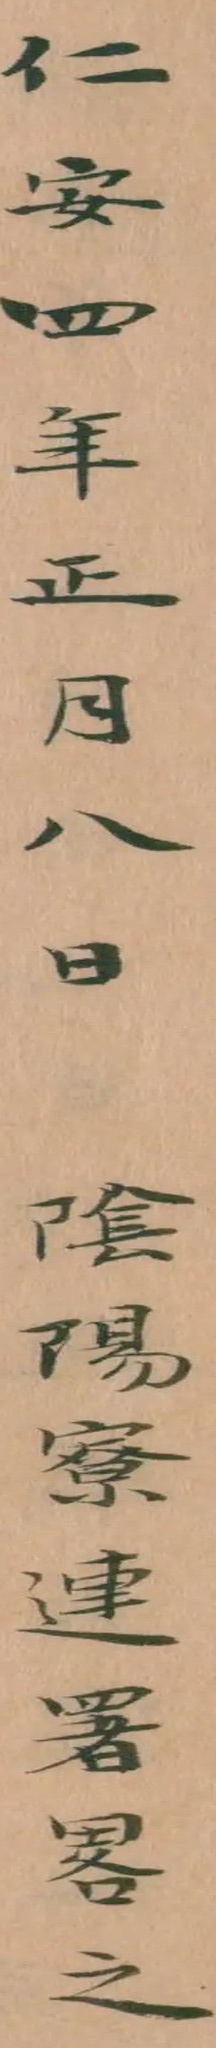仁安四年正月八日陰陽寮連署略之
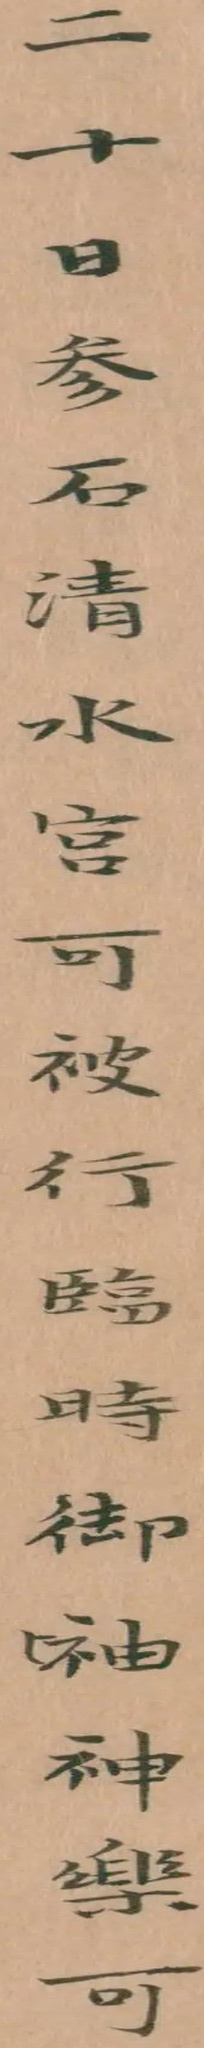二十日参石清水宮可被行臨時御袖神楽可
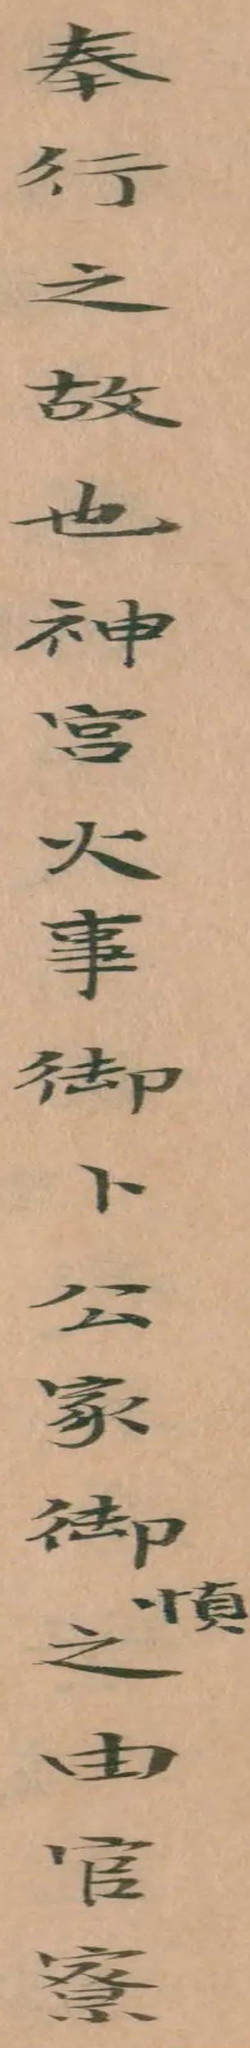奉行之故也神宮火事御卜公家御慎之由官寮
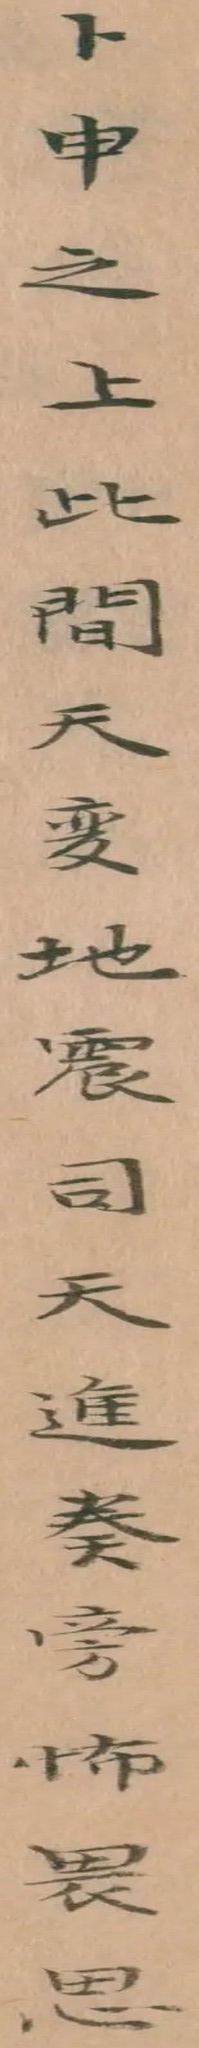卜申之上此間天変地震司天進奏旁怖畏思
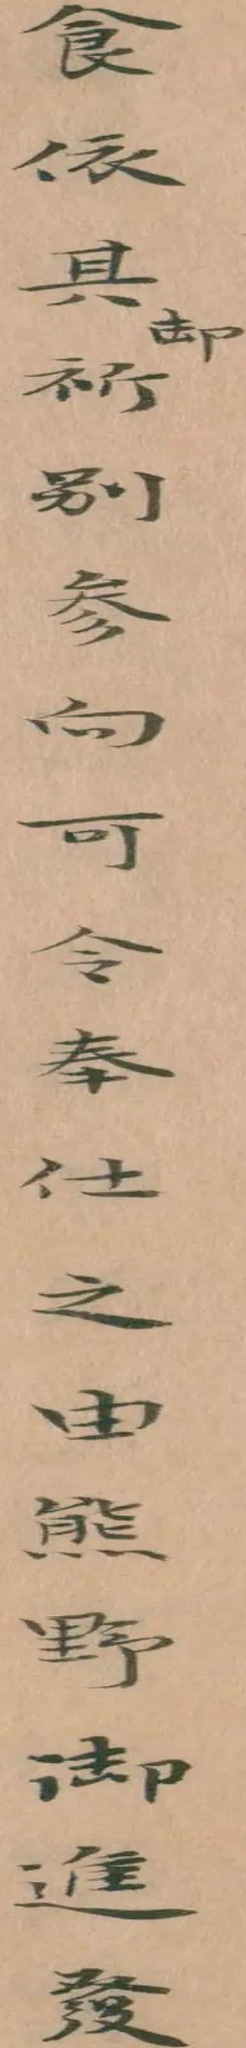食依其御祈別参向可令奉仕之由熊野御進発
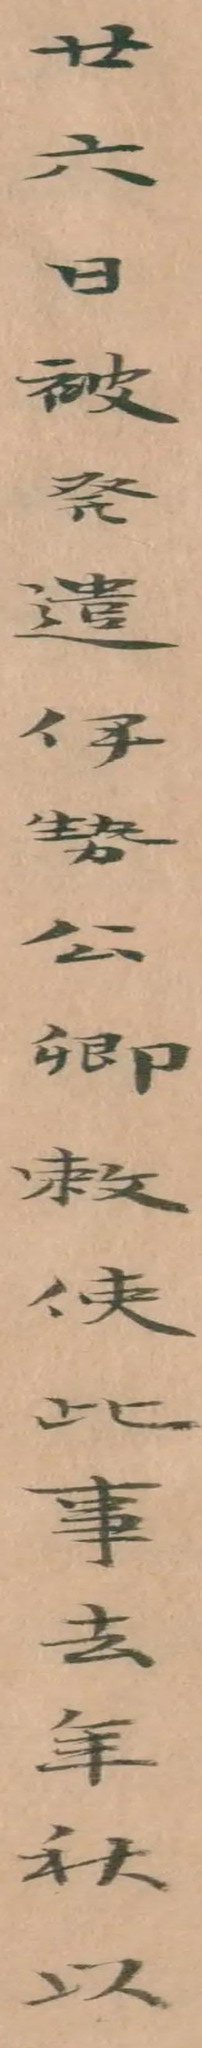廿六日被発遣伊勢公卿敇使此事去年秋以
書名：地災撮要. 巻5-6(地震之部)
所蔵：国立国会図書館 National Diet Library, JAPAN
